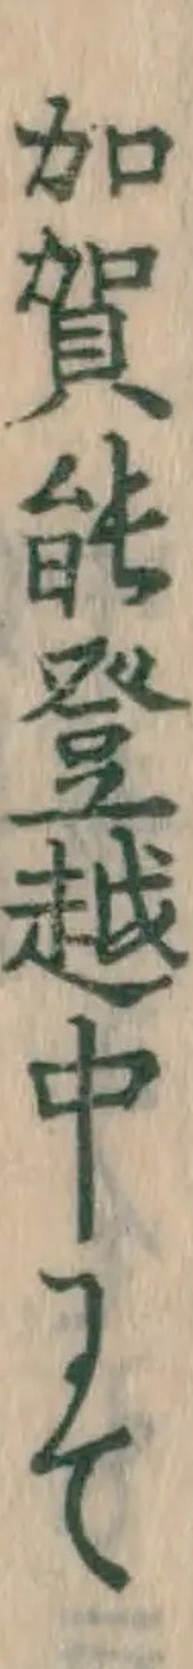加賀能登越中にて
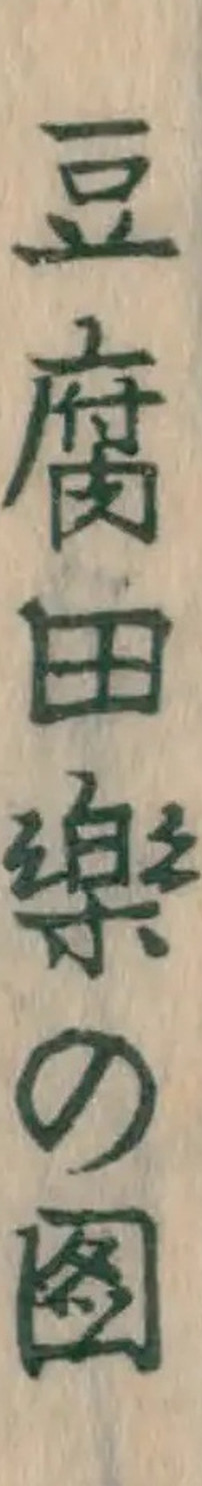豆腐田楽の図

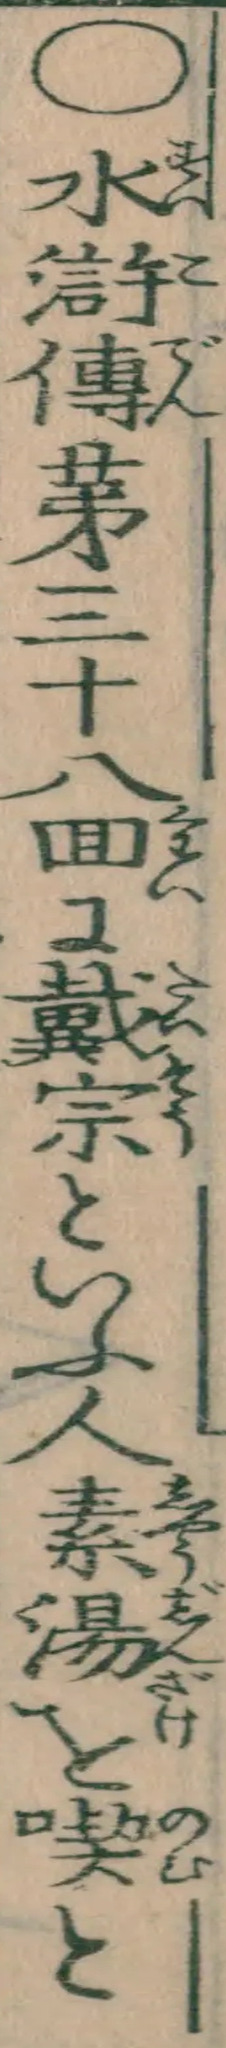○水滸伝第三十八回に戴宗といふ人素湯を喫と
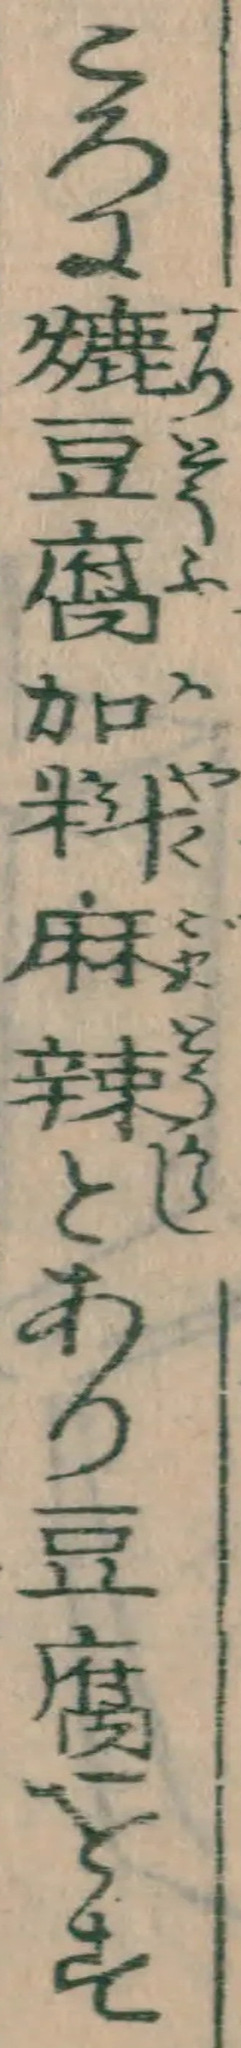ころに熝豆腐加料麻辣とあり豆腐をす
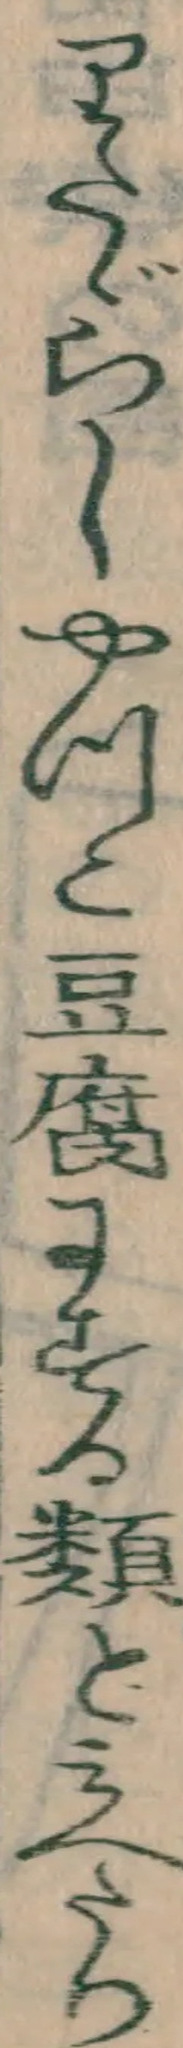りたゞらしゆつと豆腐にする類とみへたり
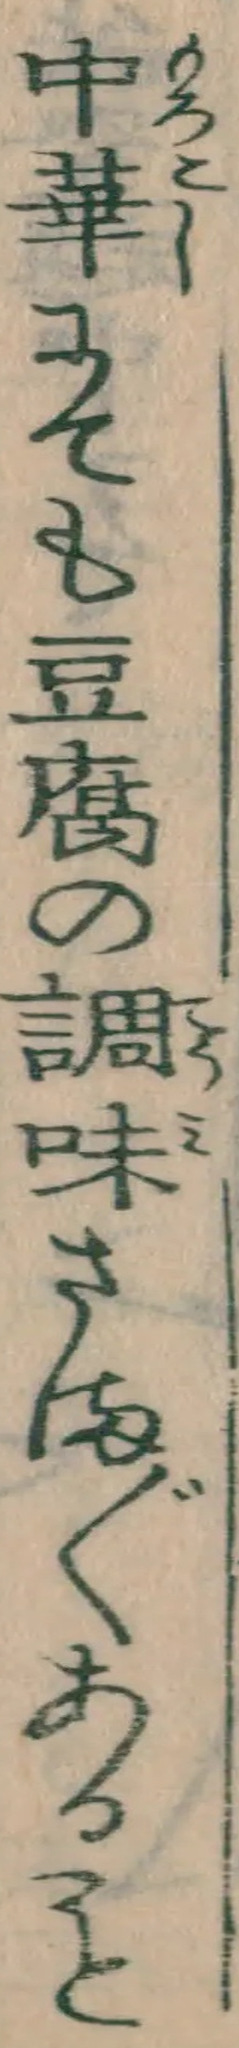中華にても豆腐の調味さま〴〵あること
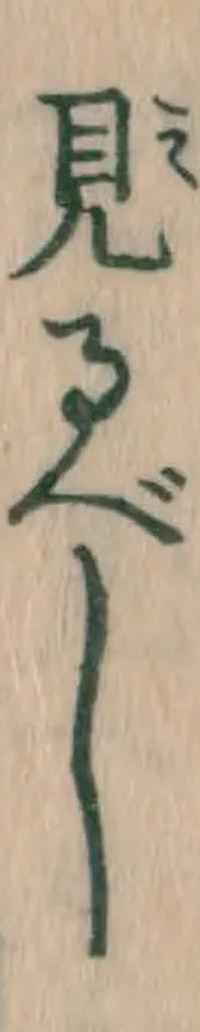見るべし
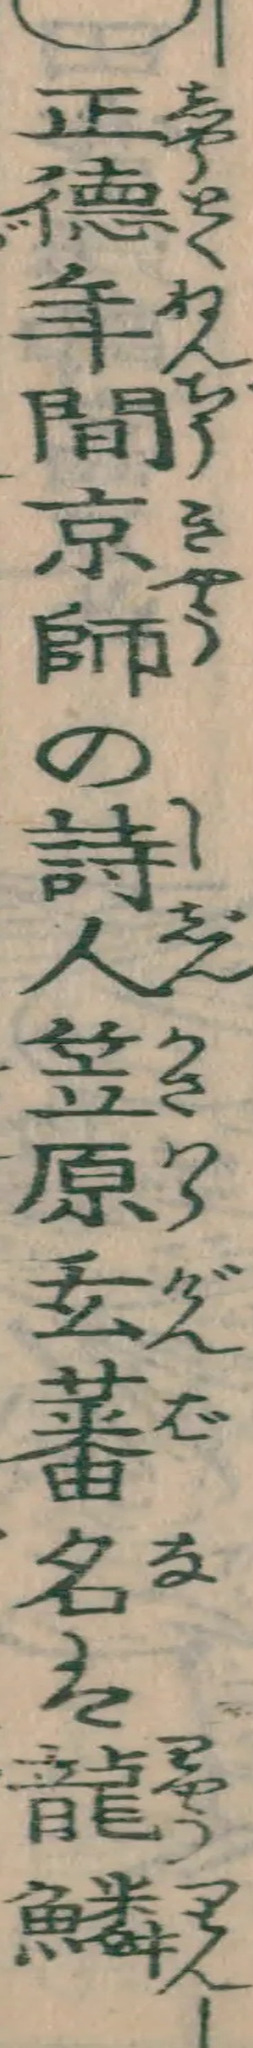○正徳年間京師の詩人笠原玄蕃名は龍鱗
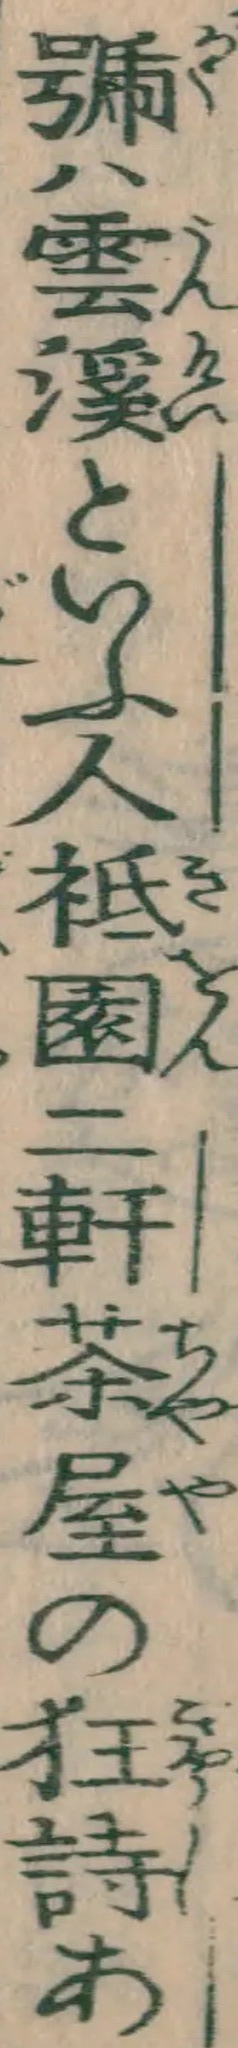号は雲溪といふ人祇園二軒茶屋の狂詩あ
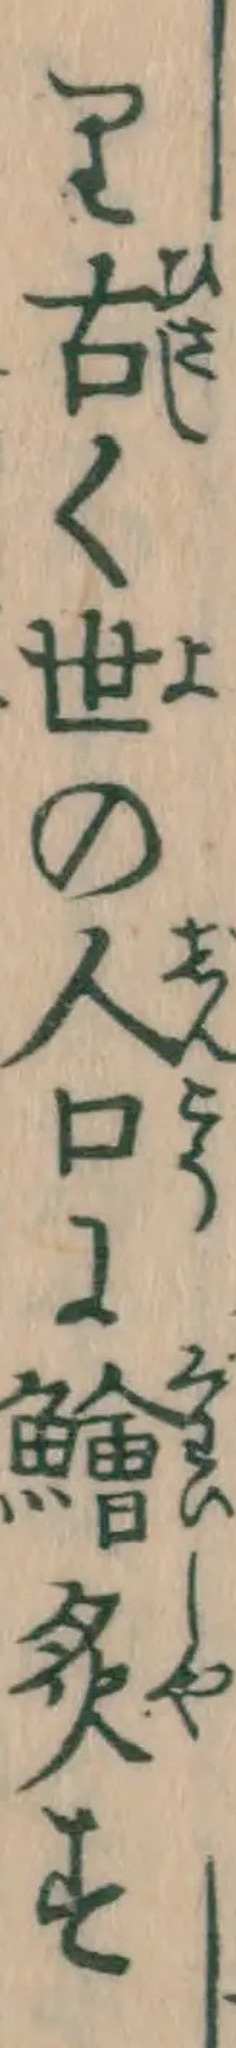り古く世の人口に鱠炙す
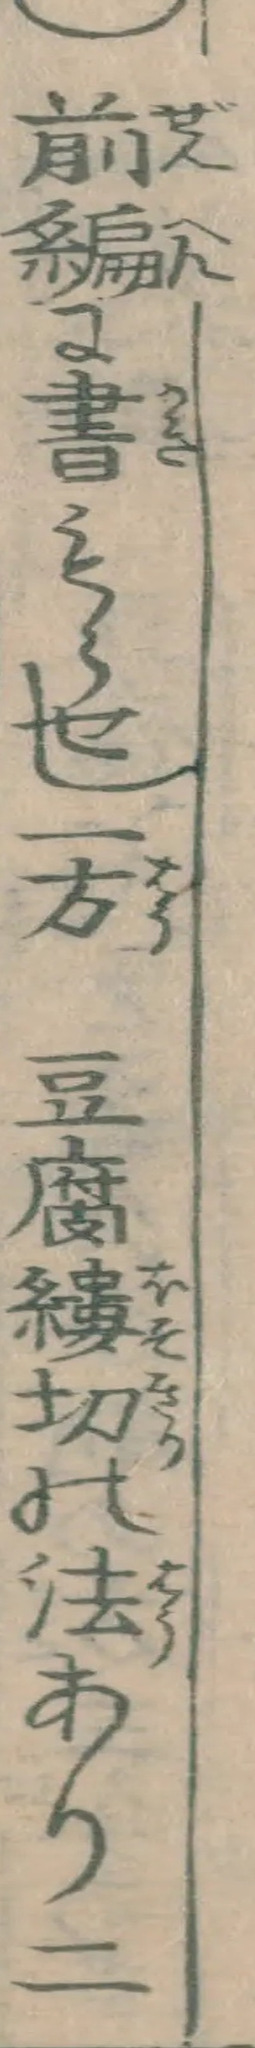○前編に書もらせし一方豆腐縷切の法あり二
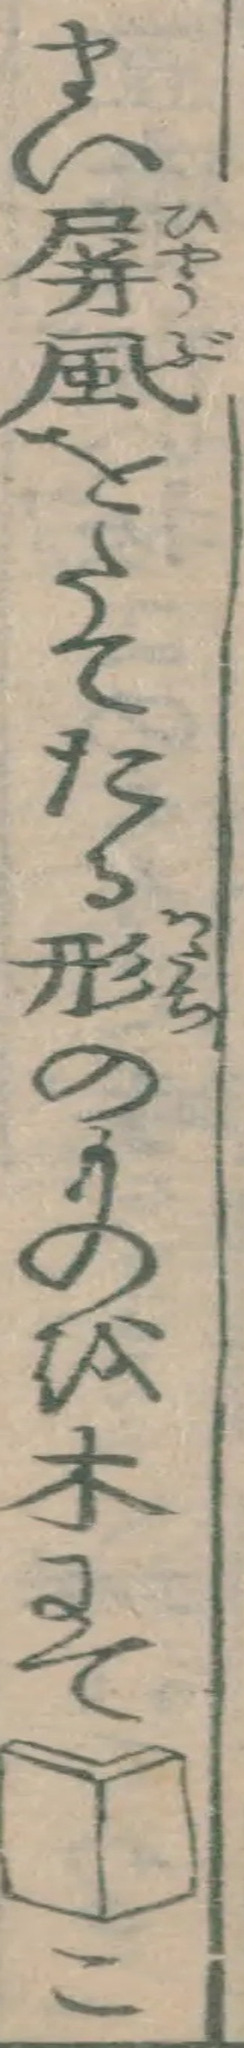まい屏風をたてたる形のものを木にてこ
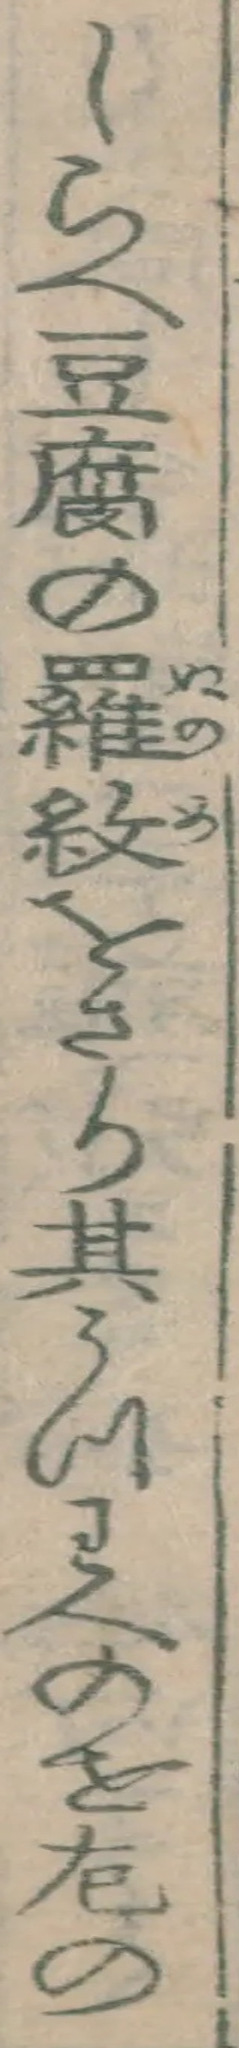しらへ豆腐の羅紋をさり其うつわへのせ左の
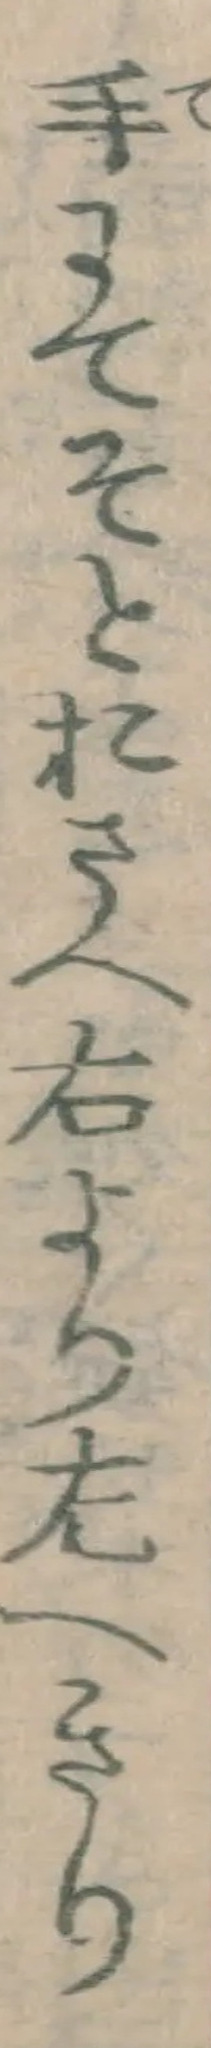手にてそとおさへ右より左へきり
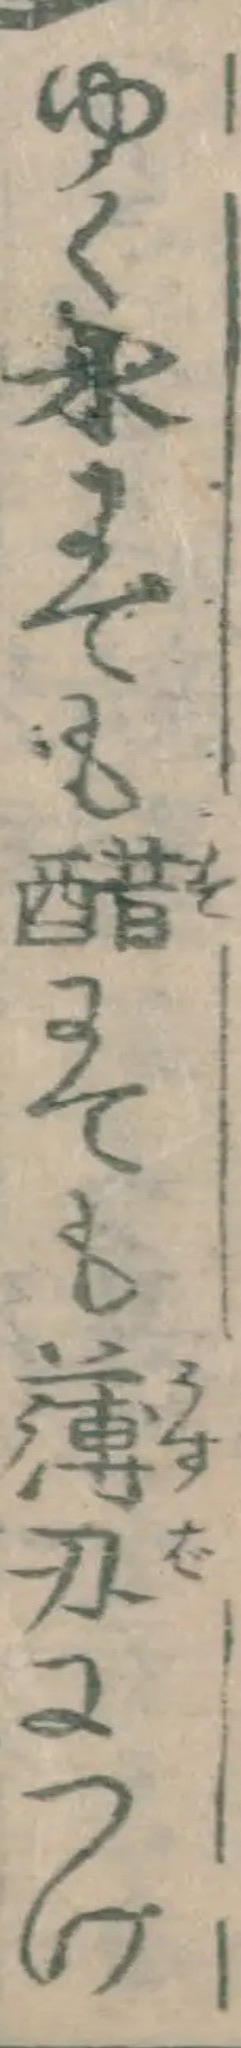ゆく水にても醋にても薄刃につけ
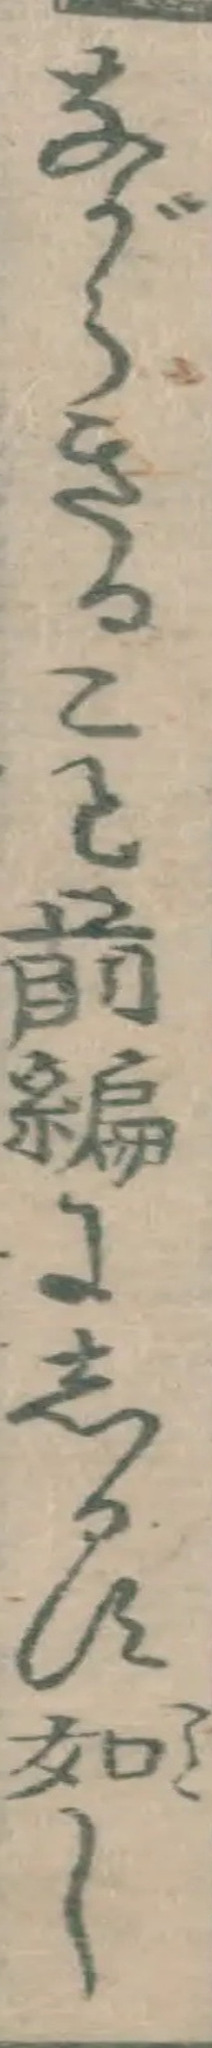ながらきること前編にしるす如し
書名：豆腐百珍. 続編
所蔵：国立国会図書館 National Diet Library, JAPAN
